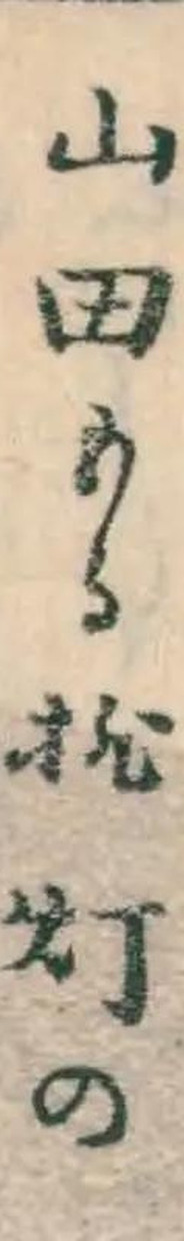山田もる提灯の
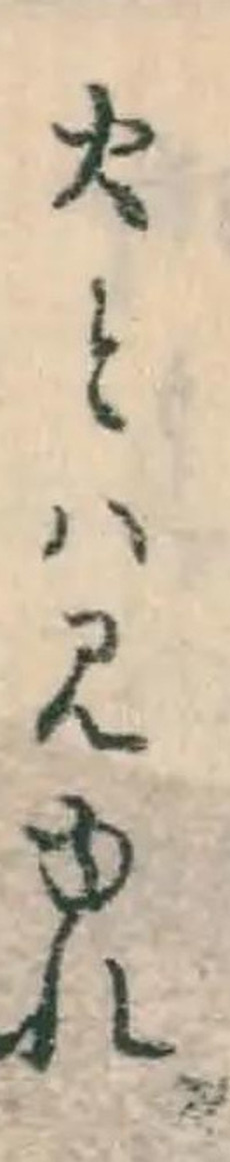火とはみゆれ
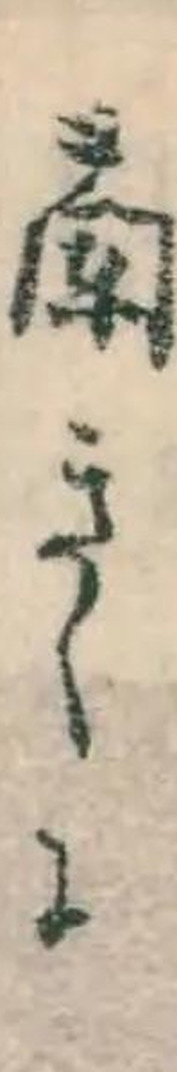蘭きくに
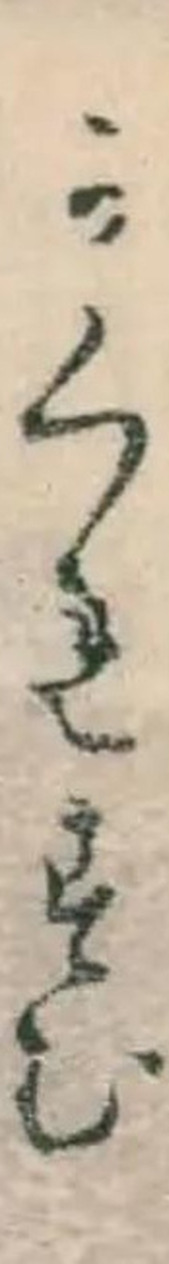かくれすむ
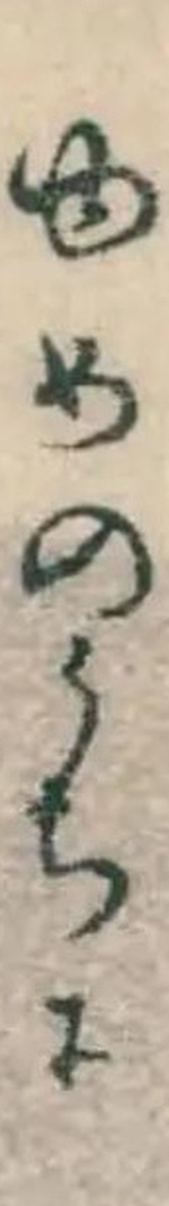ゆめのうちに
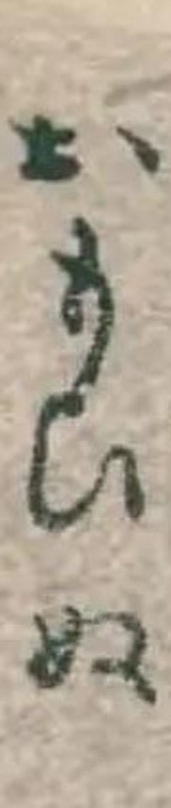おもひぬ

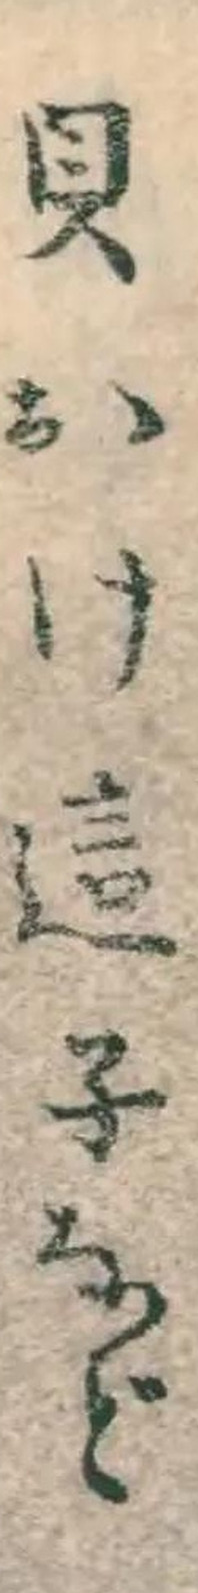貝おけ這子など
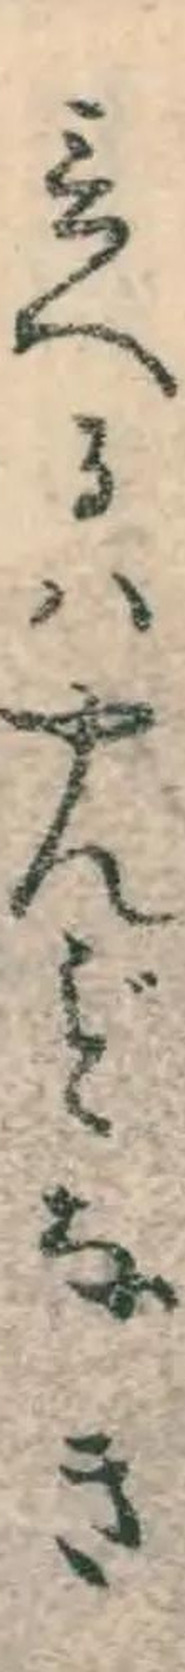言へるはやんごとなき
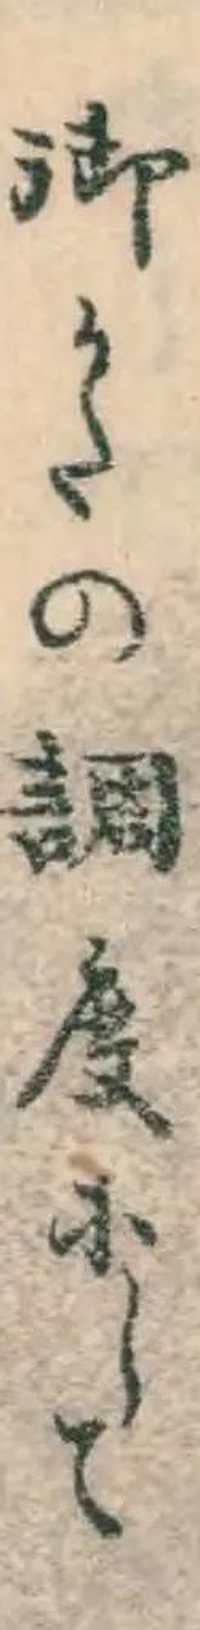御かたの調度にして
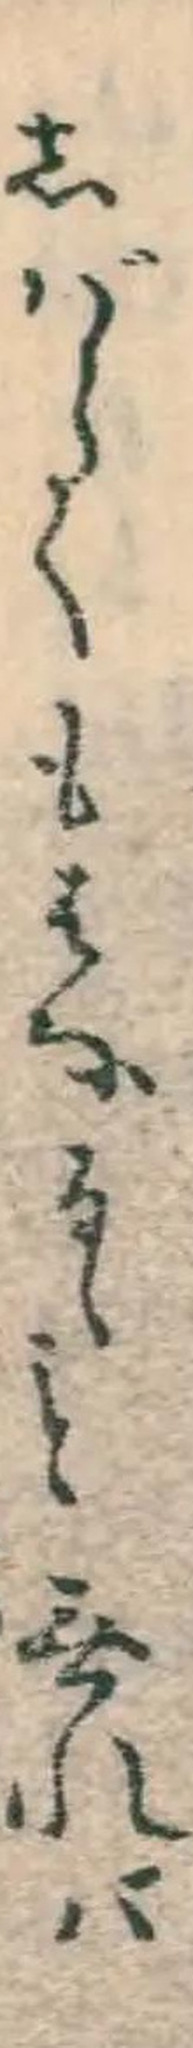しばらくもはなるゝこと無れば
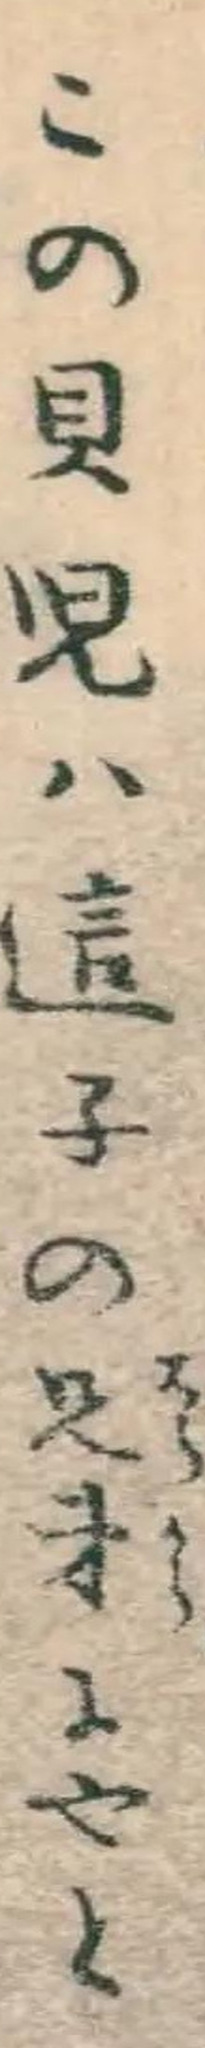この貝児は這子の兄弟にやと
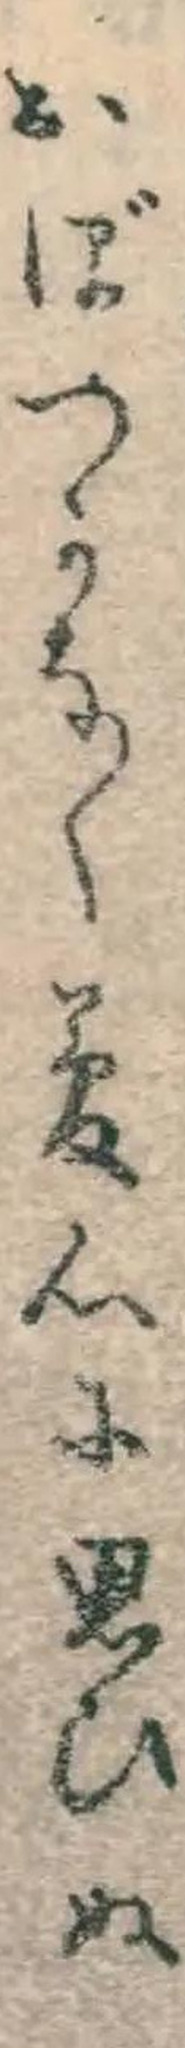おぼつかなく夢心に思ひぬ
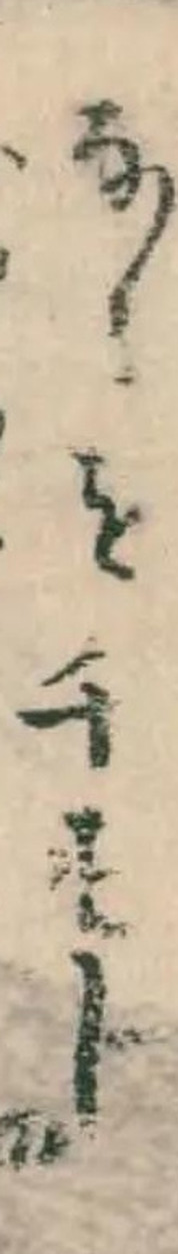なるを千すじの
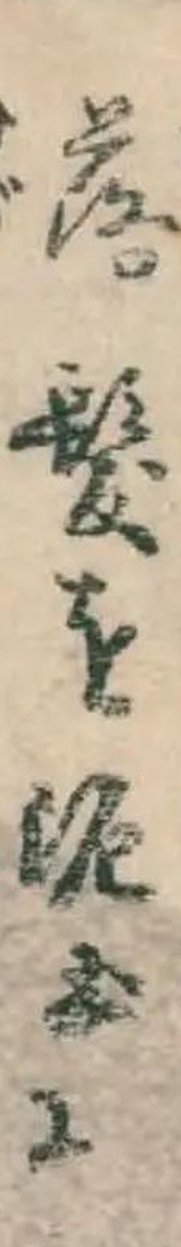落髪を泥に
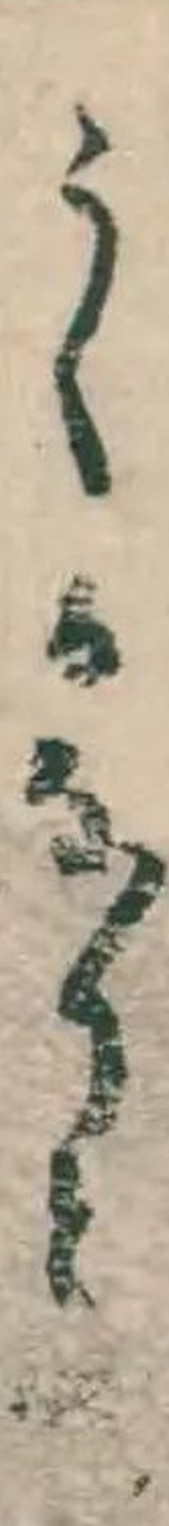うくるなりと
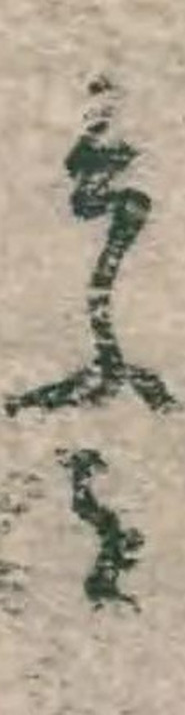言ふを
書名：百鬼徒然袋 3巻. [2]
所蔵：国立国会図書館 National Diet Library, JAPAN
